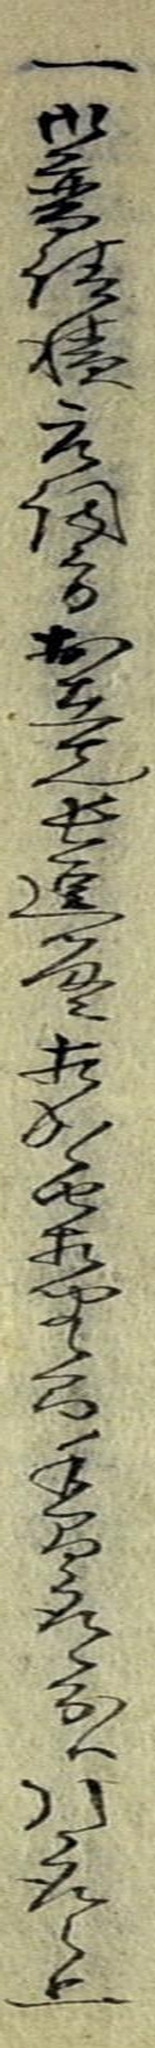一御普請積取調方於在先長逗留ニ相成候由相聞候間手間取候分ハ引取之上
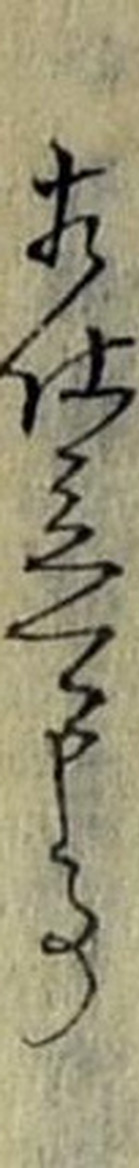相仕立可申事
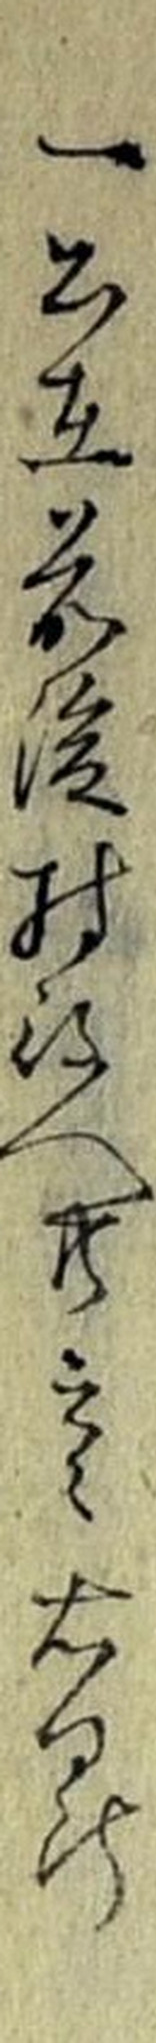一出在前後村役人共云々右同断
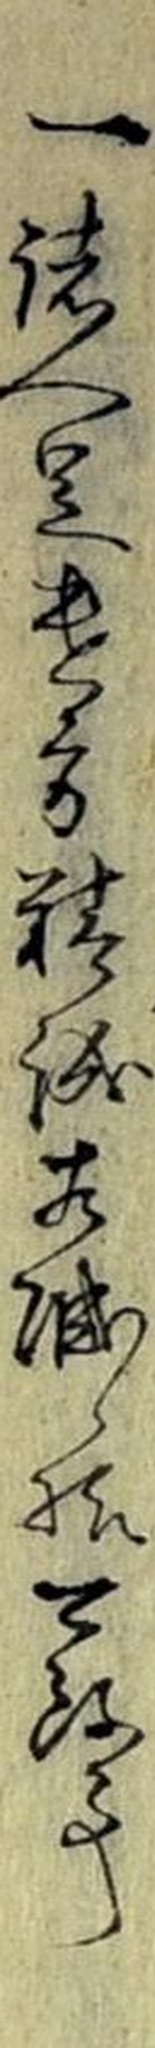一諸人足遣方精誠相減候様可致事
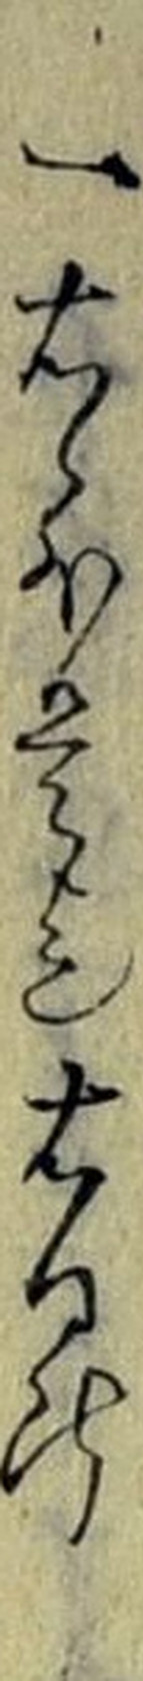一右之外是迄右同断
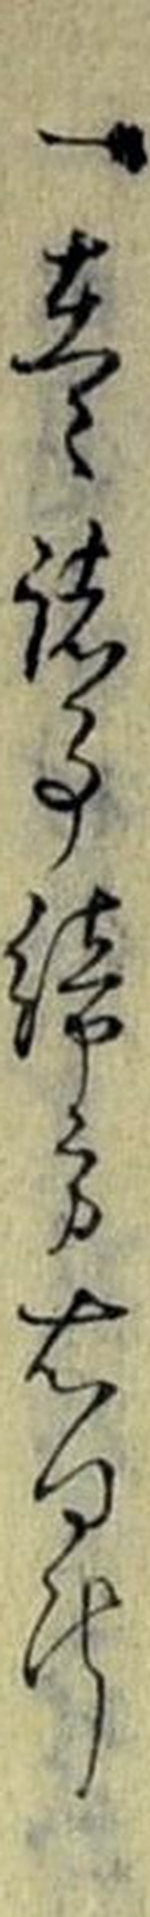一在々諸事締方右同断
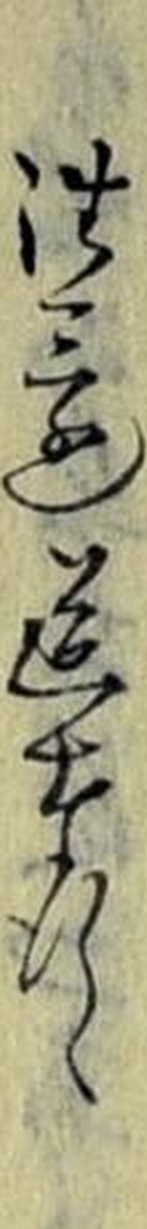往還道奉行へ
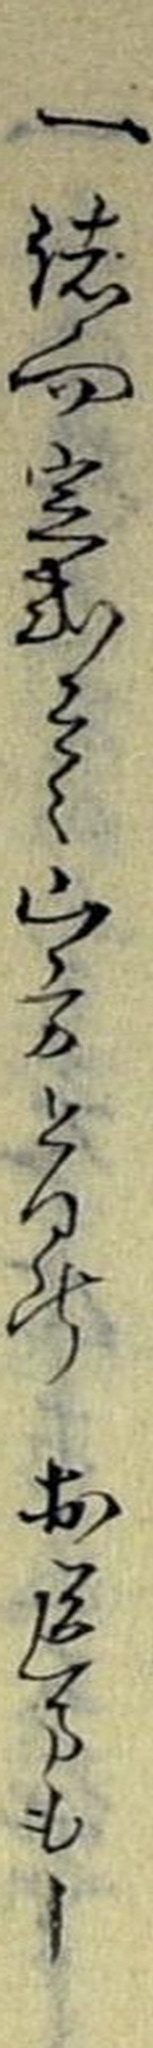一諸向定式云々山方と同断於道方も―
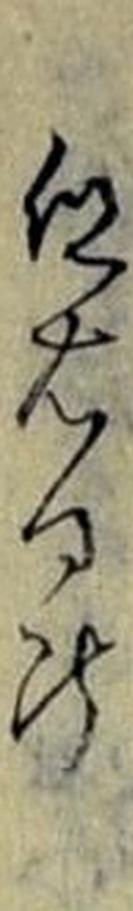但右同断
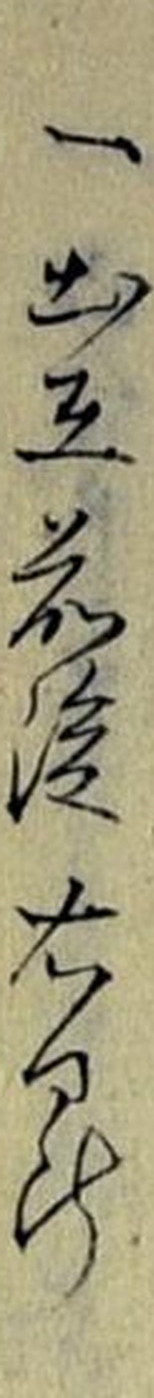一出在前後右同断
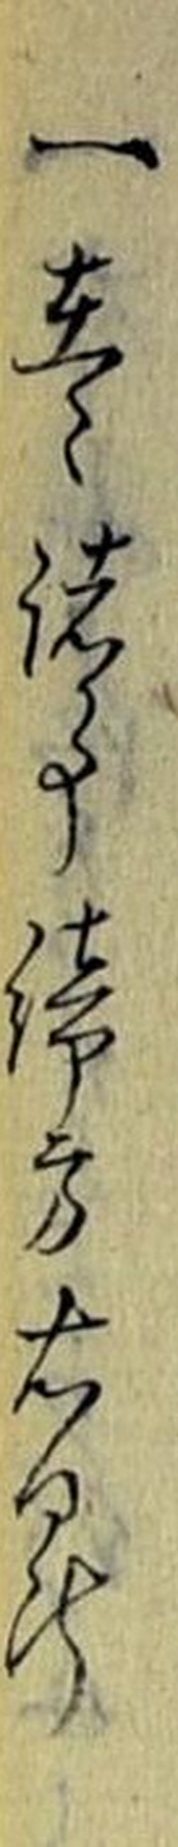一在々諸事締方右同断
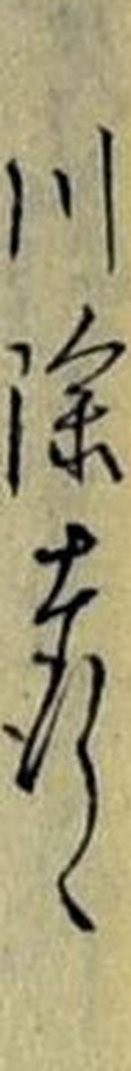川除奉行へ
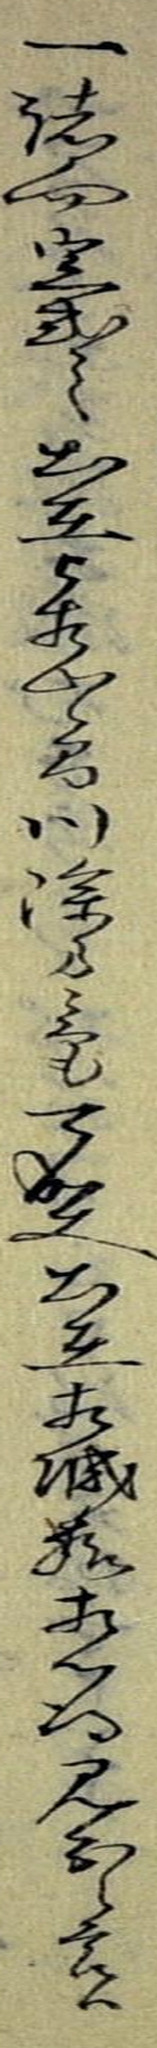一諸向定式之出在被相止候間川除方ニ而も可成丈出在相減様相心得見分之節ハ
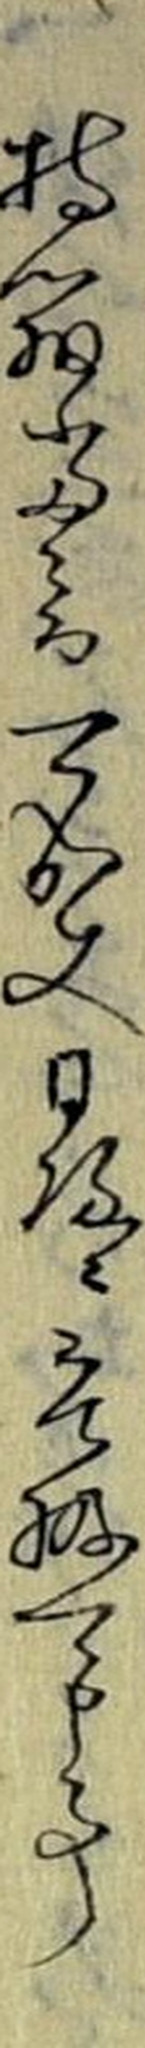持弁当ニ而可成丈日帰ニ取扱可申事
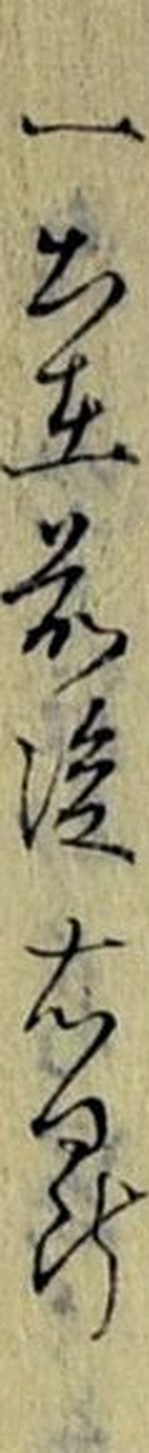一出在前後右同断
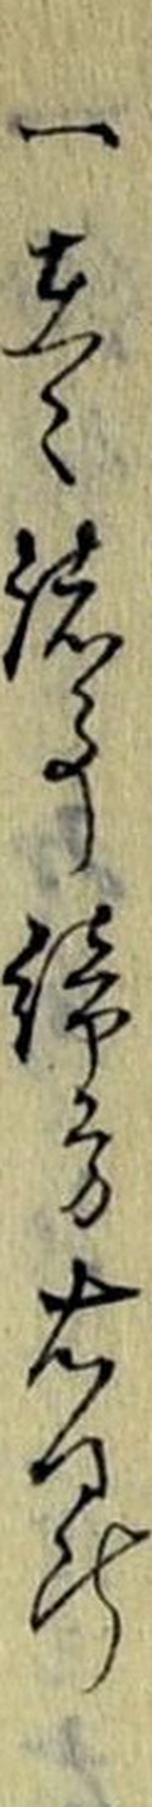一在々諸事締方右同断
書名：命令之部 五
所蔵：福井県文書館 Fukui Prefectural Archives
